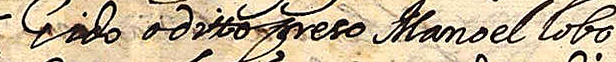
E ido o ditto preso Manoel lobo
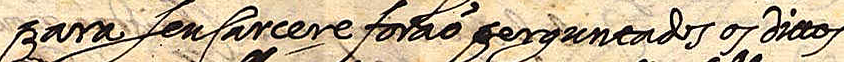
para seu Carçere foraõ perguntados os dittos
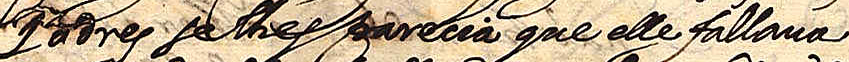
Padres se lhes parecia que elle fallaua
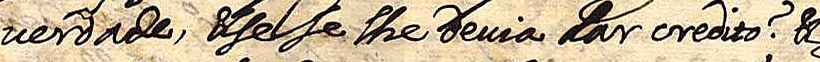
uerdade, & se se lhe deuia dar credito? &
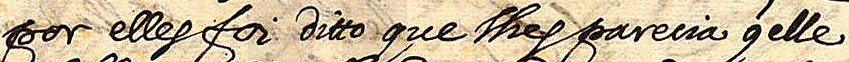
por elles foi ditto que lhes parecia q̄ elle
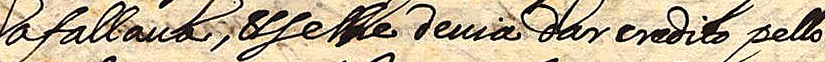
a fallaua, & se lhe deuia dar credito pello
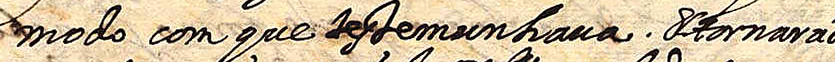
modo com que testemunhaua. & tornaraõ
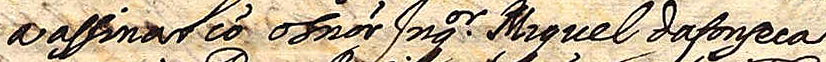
a assinar cō o Snor̄ Jnqor. Miguel da fonseca
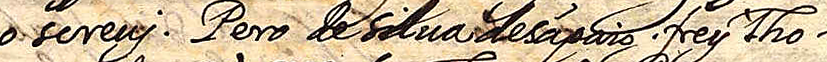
o screuj. Pero de Silua de sāpaio. frey Tho
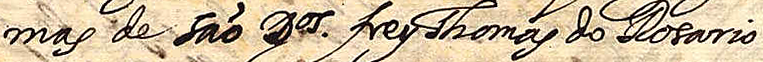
mas de Saõ Dos. frey Thomas do Rosario.
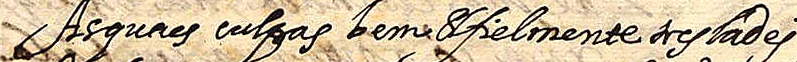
As quaes culpas bem & fielmente tresladej
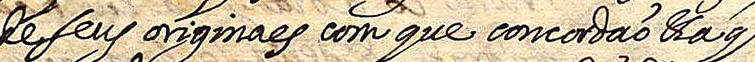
de seus originaes com que concordaõ & a q̄
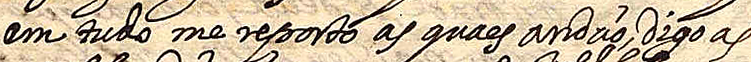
em tudo me reporto as quaes andaõ, digo as
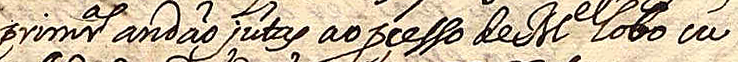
primras andão jūtas ao ꝓçesso de Mel lobo cu
